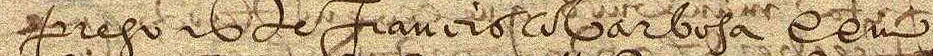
preso este francisco barbosa e em
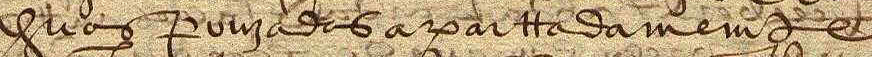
suas pouzadas aparttadamemte
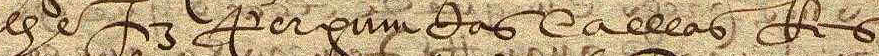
lhe fez pergumtas e a ellas Res
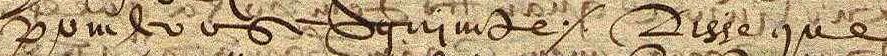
pomdeo o segujmte ./. Disse que
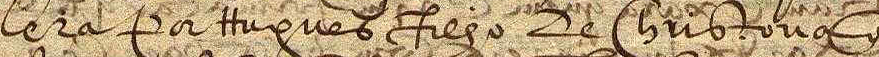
era porttugues filho De Christouaõ
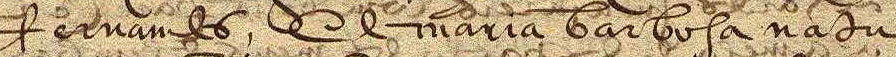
fernamdes, e de maria barbosa natu
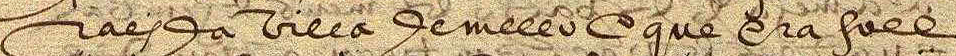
raes da villa de mello e que era soll
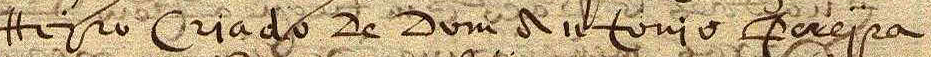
ttejro Criado De Dom Antonio Perejra
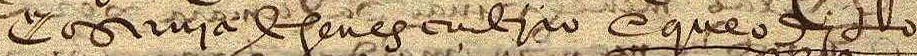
E o seruja de seu esçudejro e que o djto
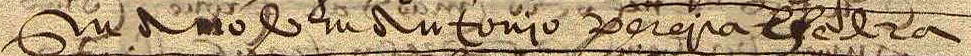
Seu Amo dom Antonjo perejra lhe dera
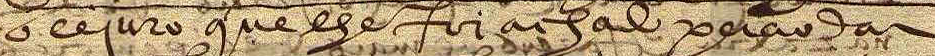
o lljuro que lhe foi achado pera o dar
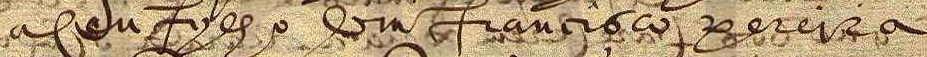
a seu fylho dom francisco perejra
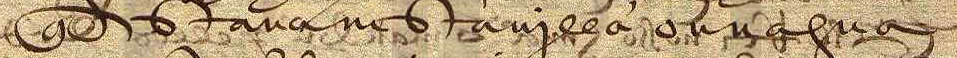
q̄ estaua nesta ujlla ou na sua
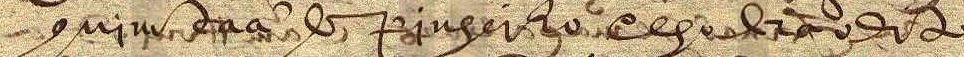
quimtaā do pjnheiro e lho dera o dito
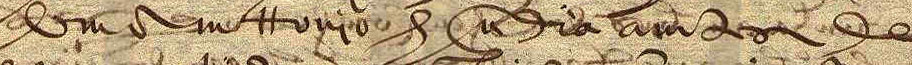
dom Amttonjo hū dia amtes de
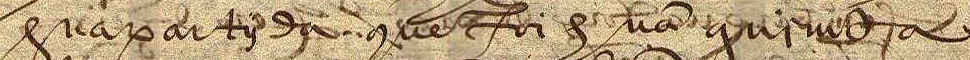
sua partyda que foi huā qujmta
